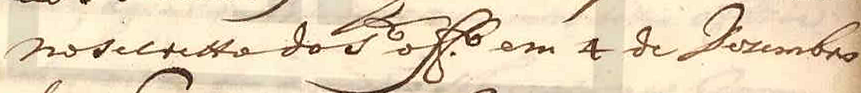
no secretto do sto off.o em 4 de Dezembro
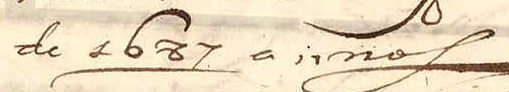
de 1687 annos
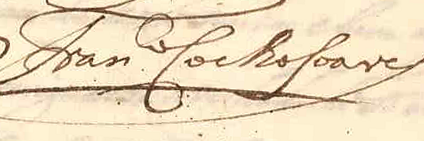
Franco Coelho Soares
